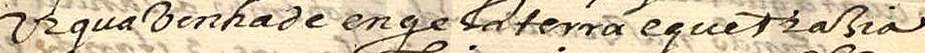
Vrqua venha de engelaterra e que trazia
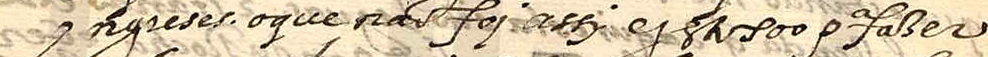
jngreses. o que nao foj assy e jsto soo pa fazer
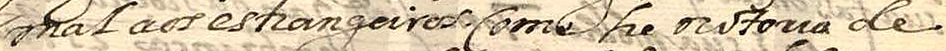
mal aos estrangeiros Como he notorio de
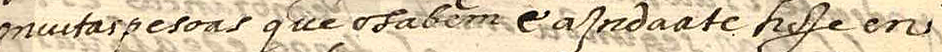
muitas pesoas que o sabem e aJnda ate hoJe en
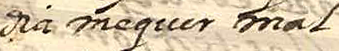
dia me quer mal
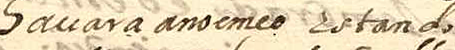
hauara ano e meo Estando
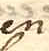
en
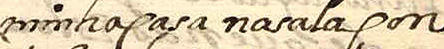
minha Casa na sala Con
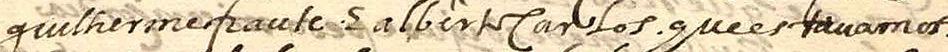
guilherme fraute E alberto Carlos que estauamos
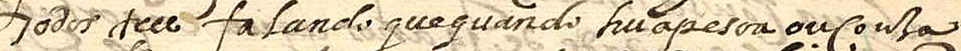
Todos tres falando que quando hua pesoa ou Couza
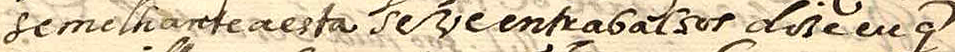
semelhante a esta se ve en trabalhos dize eu q̄
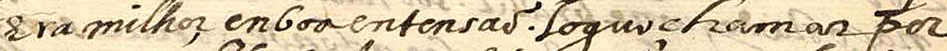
Era milhor en boa entensaõ. Loguo çhamar por
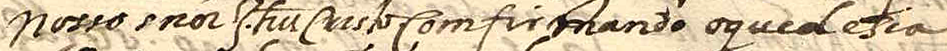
nosso snōr Jh̄u Cristo Comfirmando o que desia
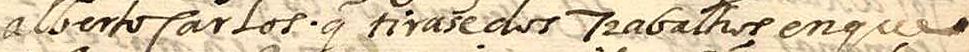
alberto Carlos. q̄ tirase dos Trabalhos en que
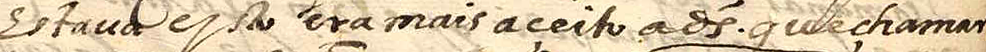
Estaua e jsto era mais açeito a ds̄. que çhamar
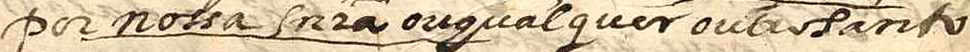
por nossa snr̄a ou qualquer outro santo
